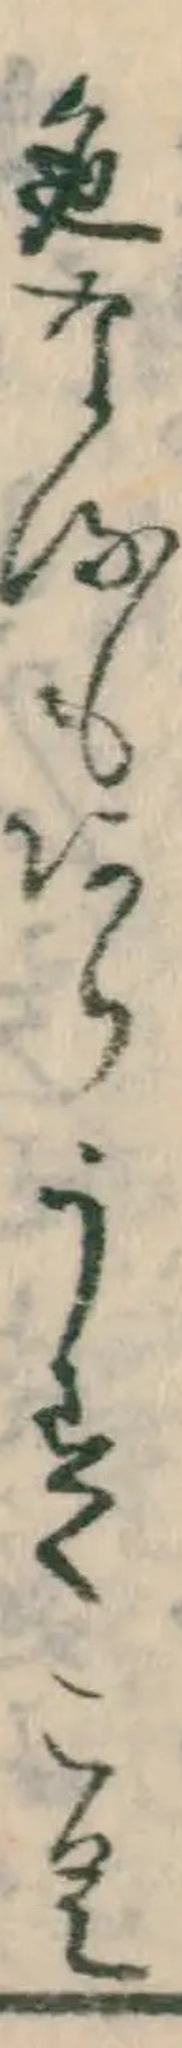色なるもありうすくこく
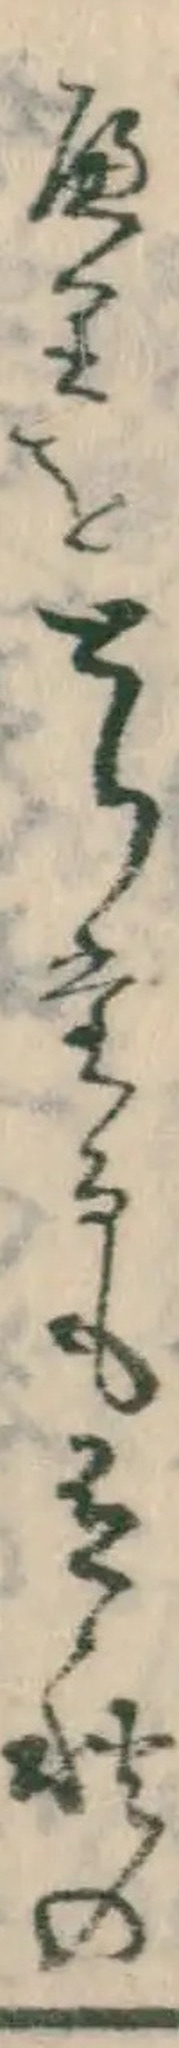へりをとりたるも有秋の
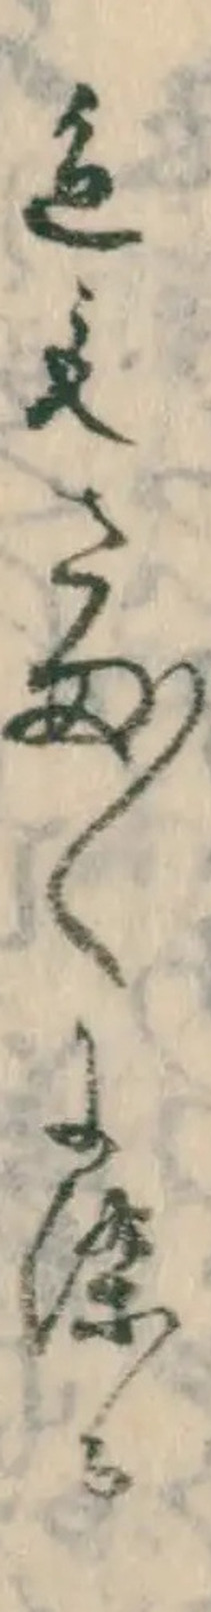色もさま〳〵に染る
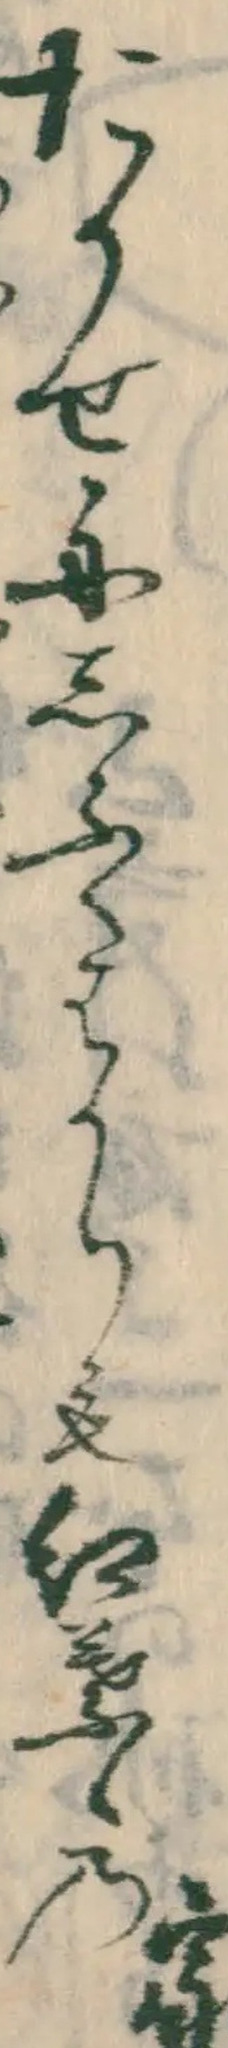たかせ舟しふくはかりも紅葉々の
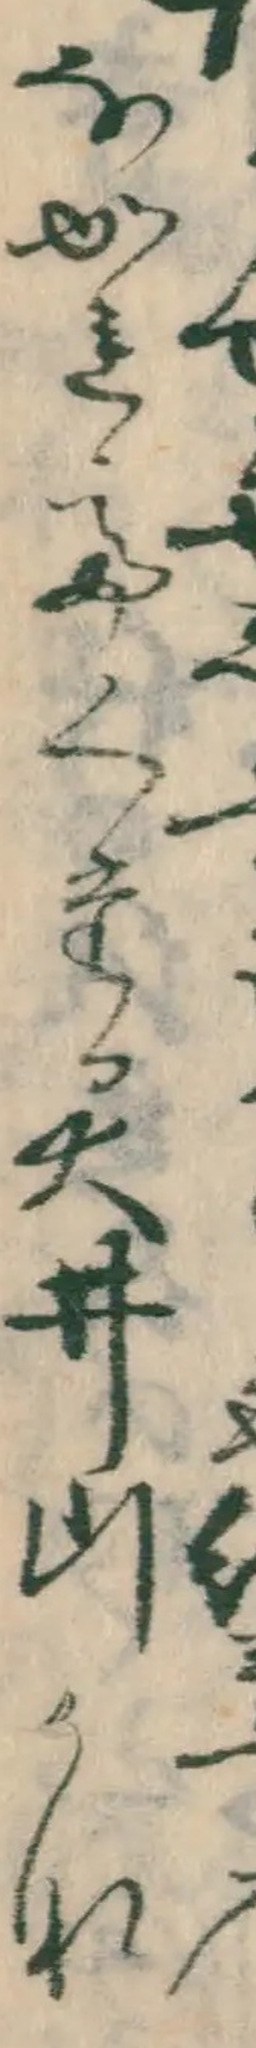なかれてくたる大井川かな

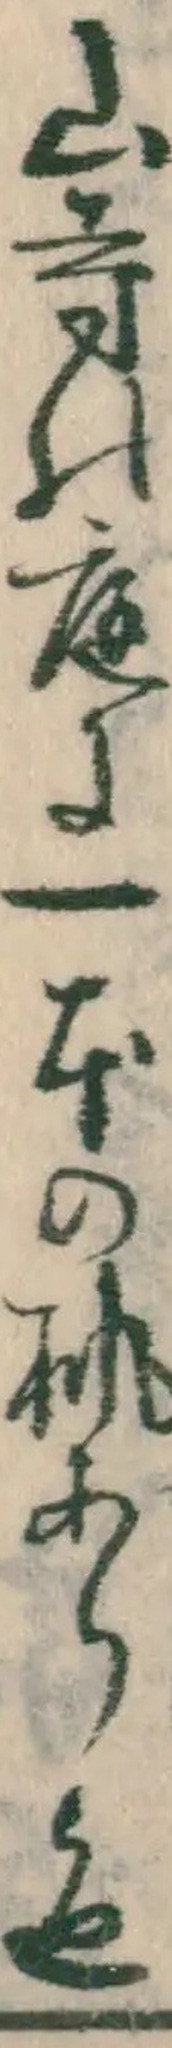山寺の庭に一本の楓あり色
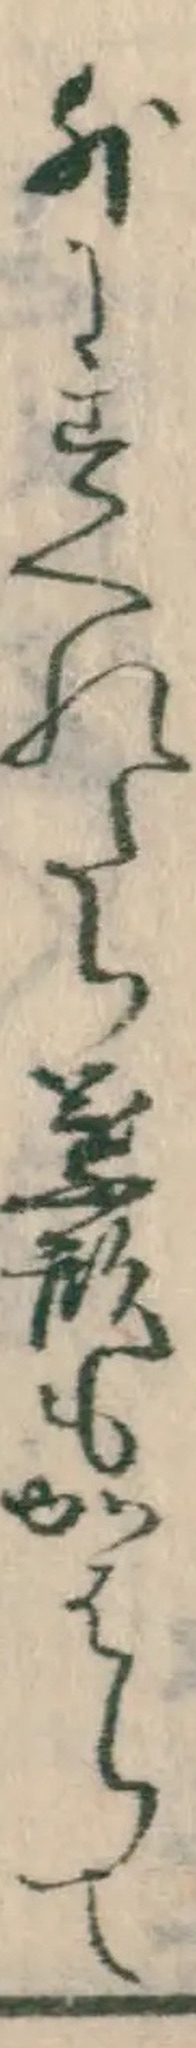外にすくれたり葉形もかはりて
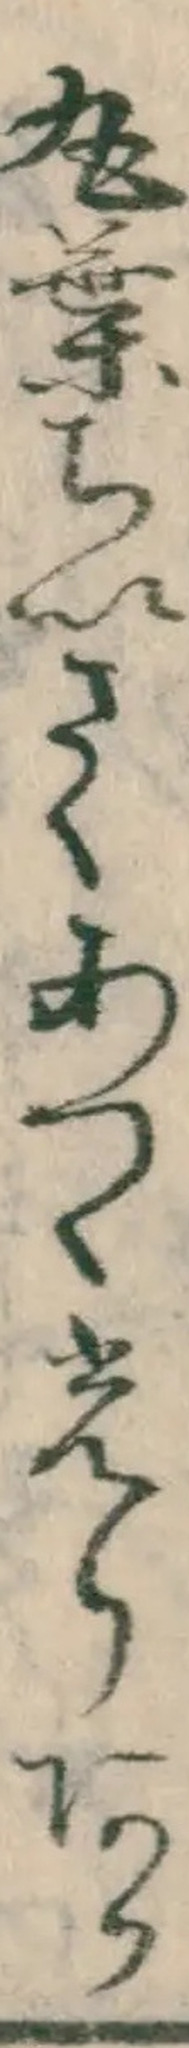丸葉ちいさくあつく光りあり
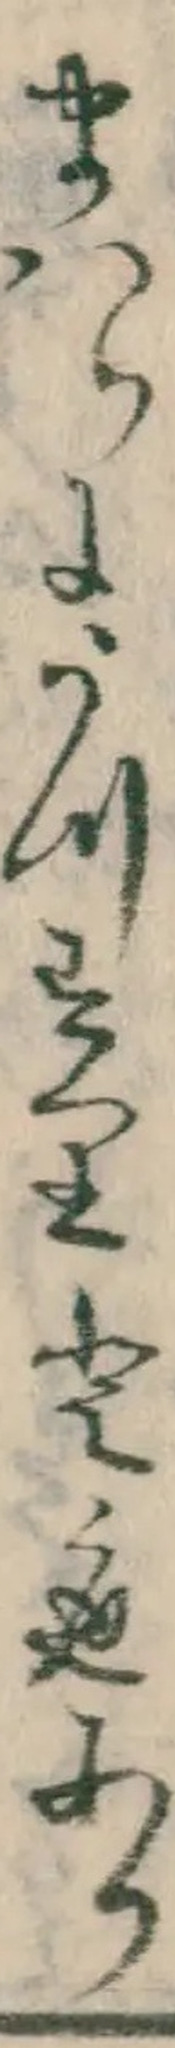まはりにうつすりと色あり
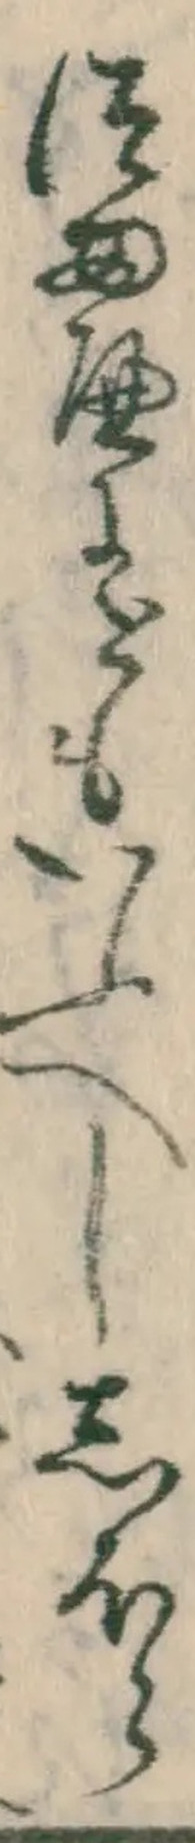つまへにともいふへししほら
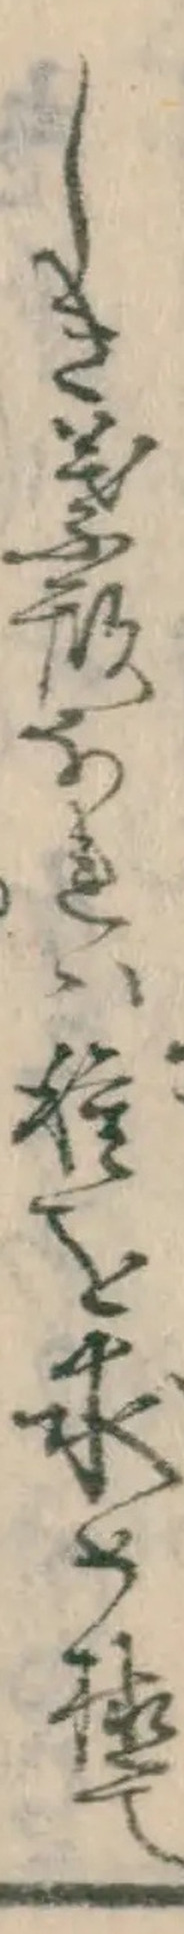しき葉形なれは種を求め植て
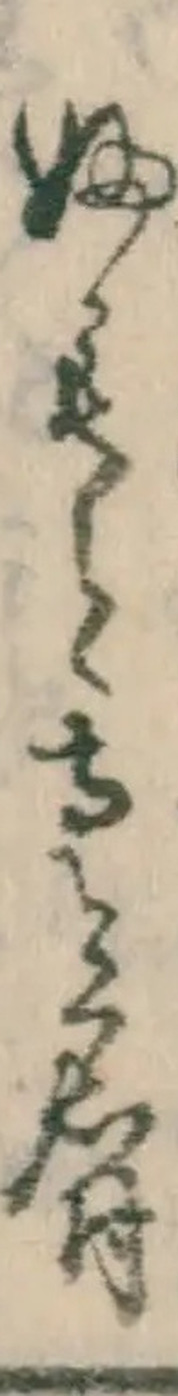ふもと寺と名付
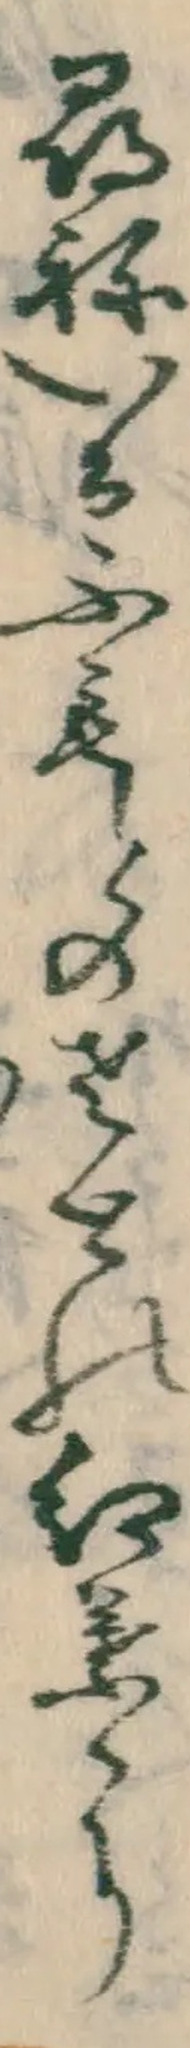尋ねいるふもとのさとの紅葉々に
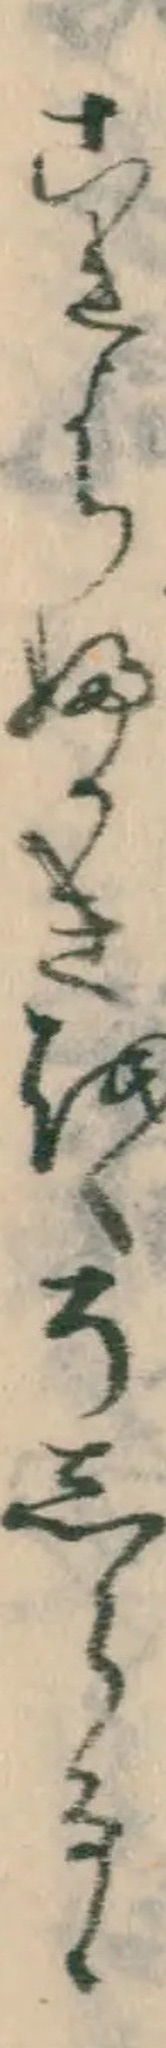これよりふかきをくそしらるゝ俊成
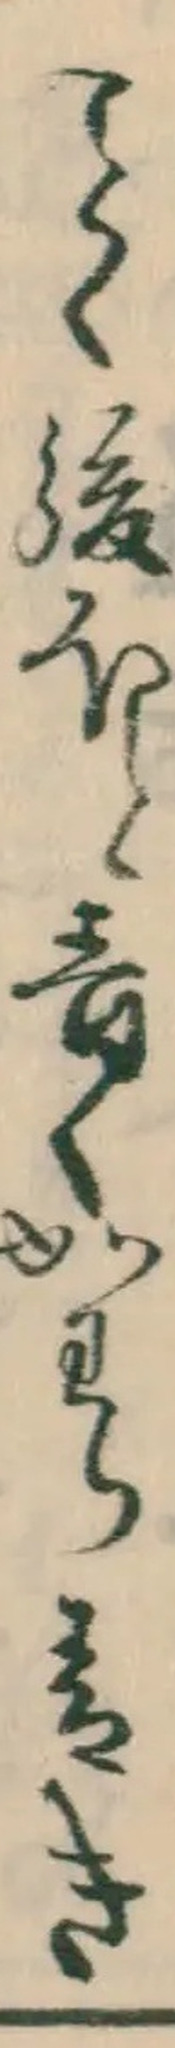ことく後ほと青くかわり青き
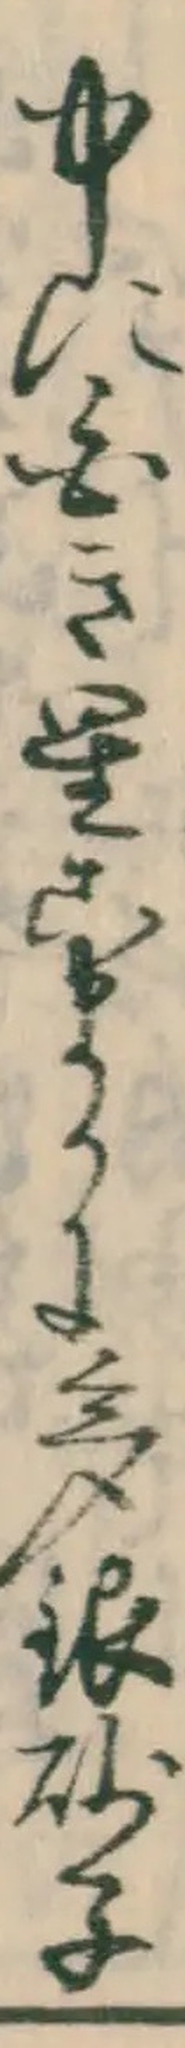中に白き星こまかに多銀砂子
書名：紅葉集
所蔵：国立国会図書館 National Diet Library, JAPAN
